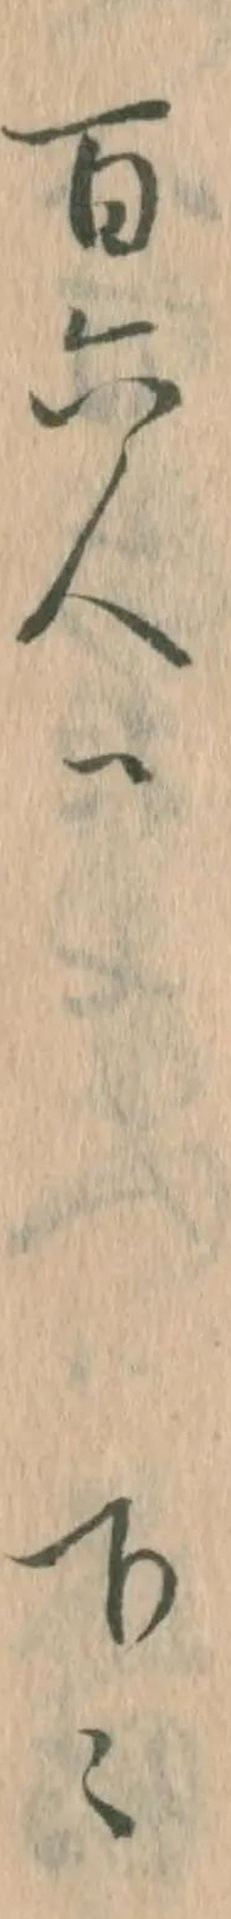百六人は下々
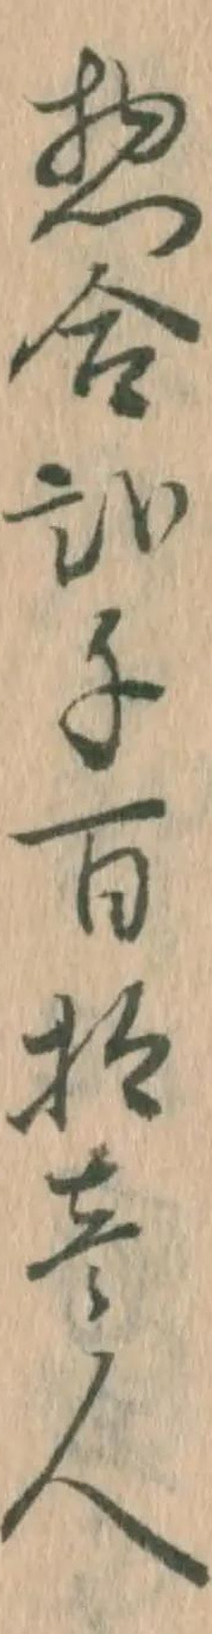惣合弐千百拾壱人
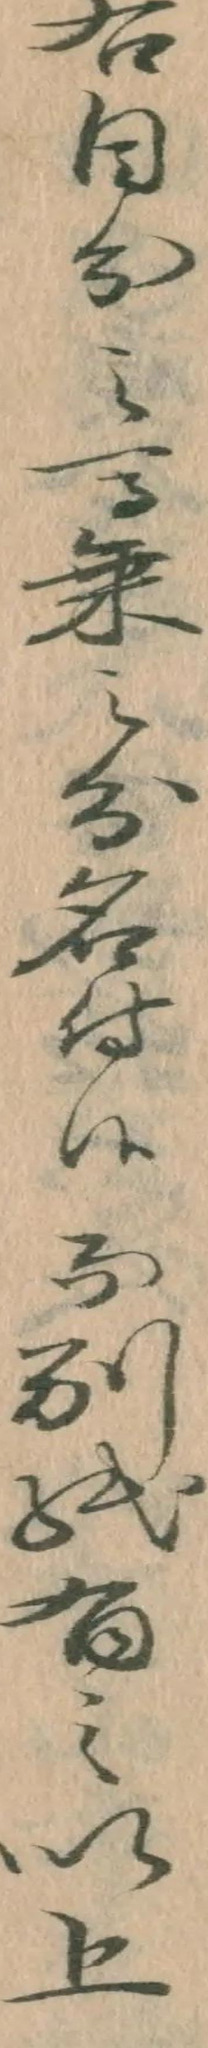右自分之馬乗之分名付候而別紙有之以上
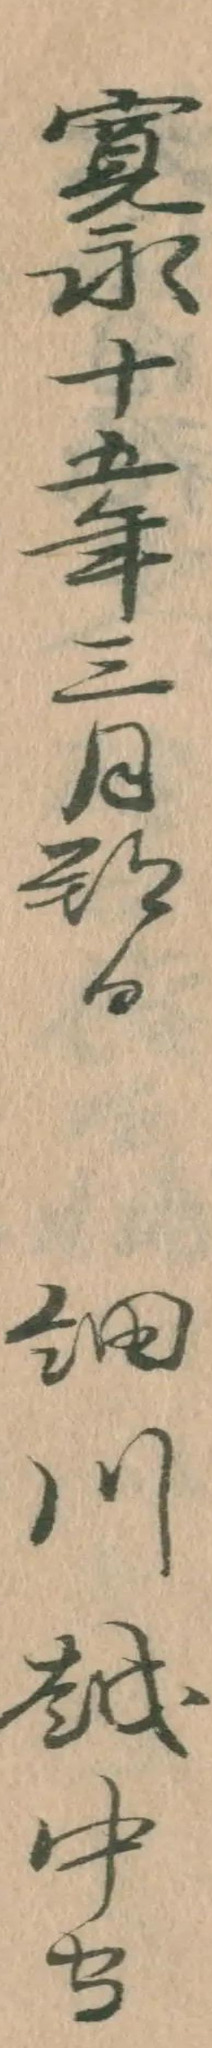寛永十五年三月朔日細川越中守
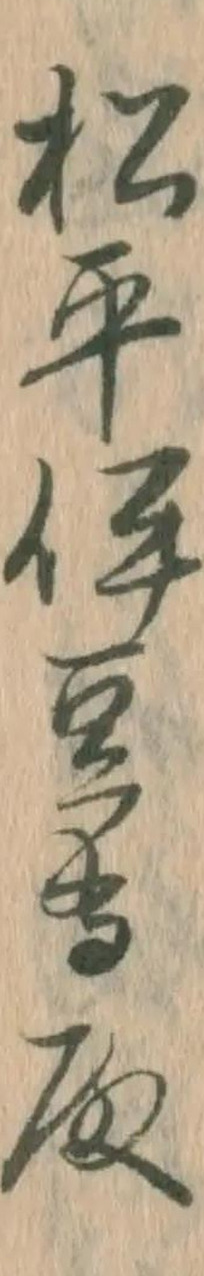松平伊豆守殿
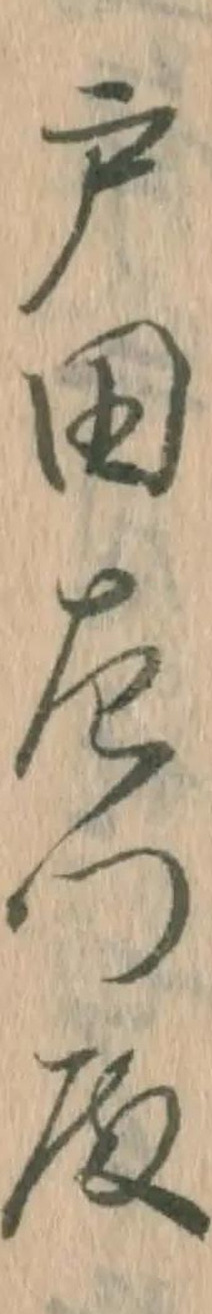戸田左門殿
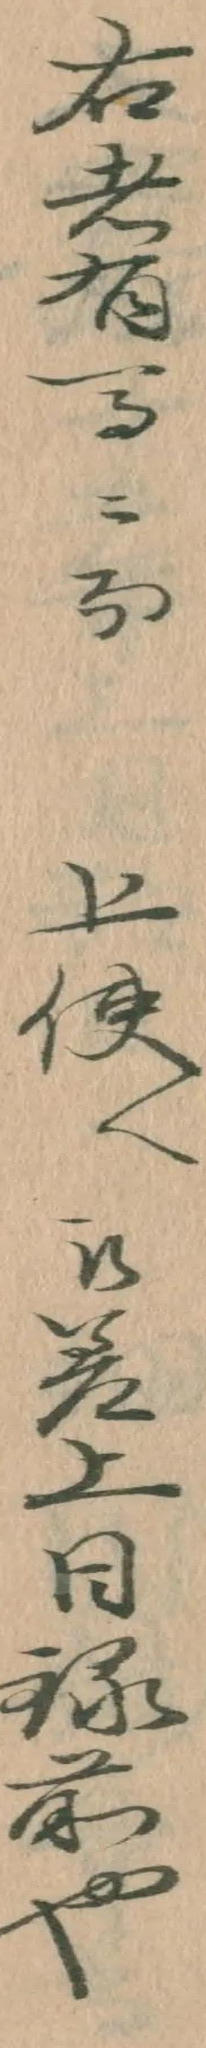右者有馬に而上使へ被差上目録前也
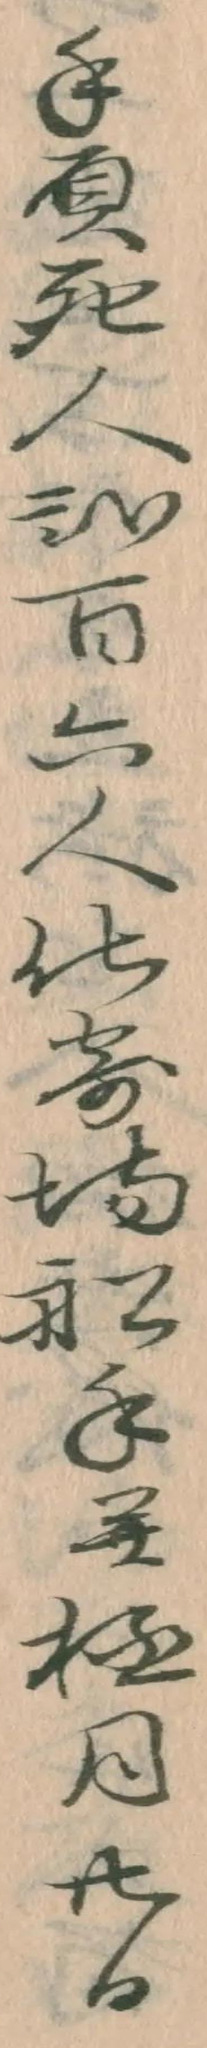手負死人弐百六人仕寄場舩出幷極月廿日
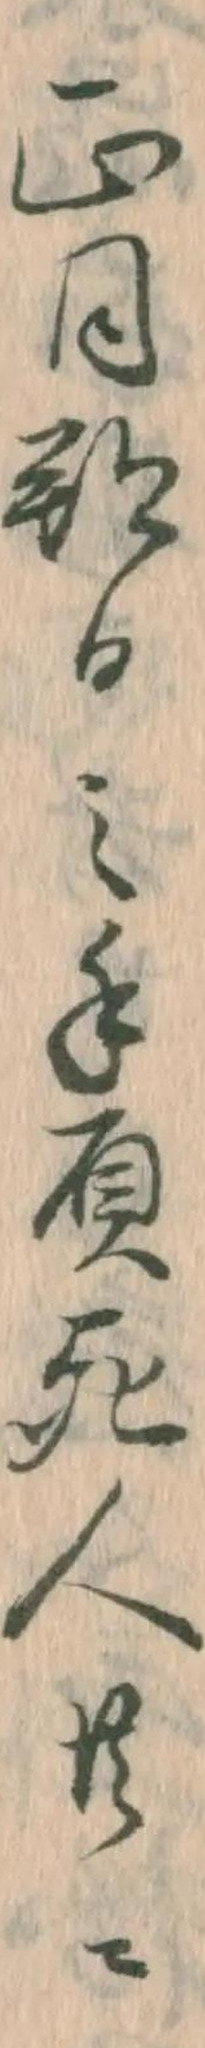正月朔日之手負死人共に
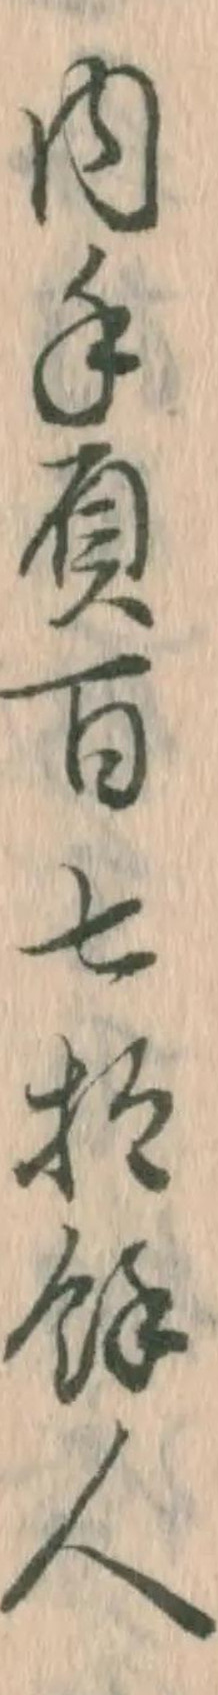内手負百七拾余人
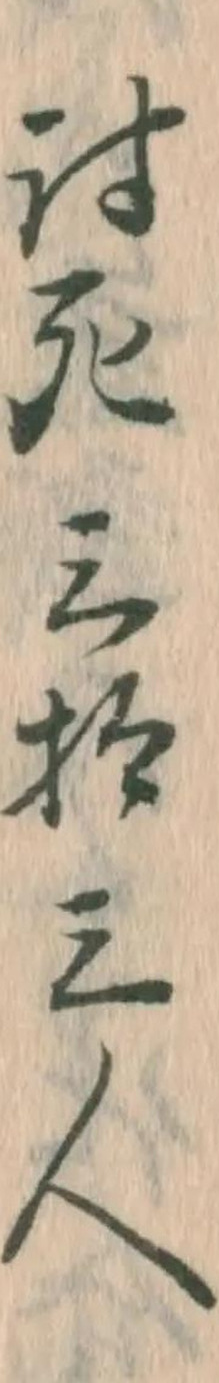討死三拾三人
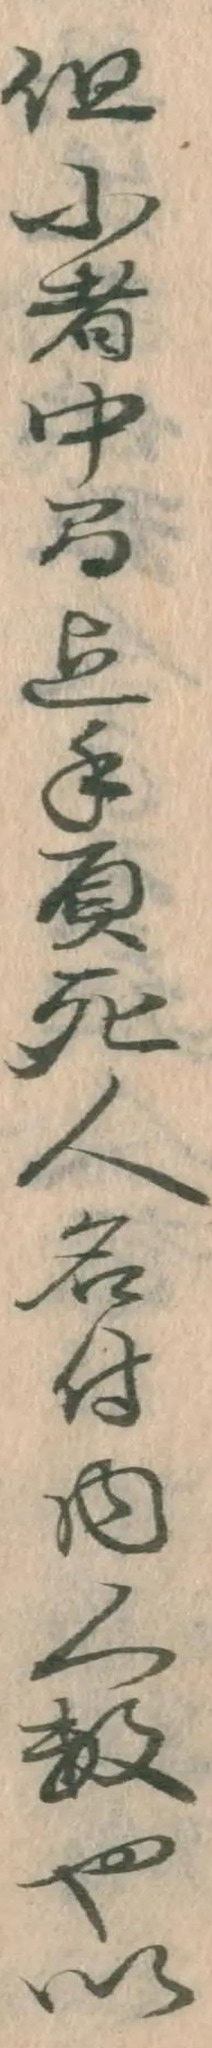但小者中間迄手負死人名付内人数也以
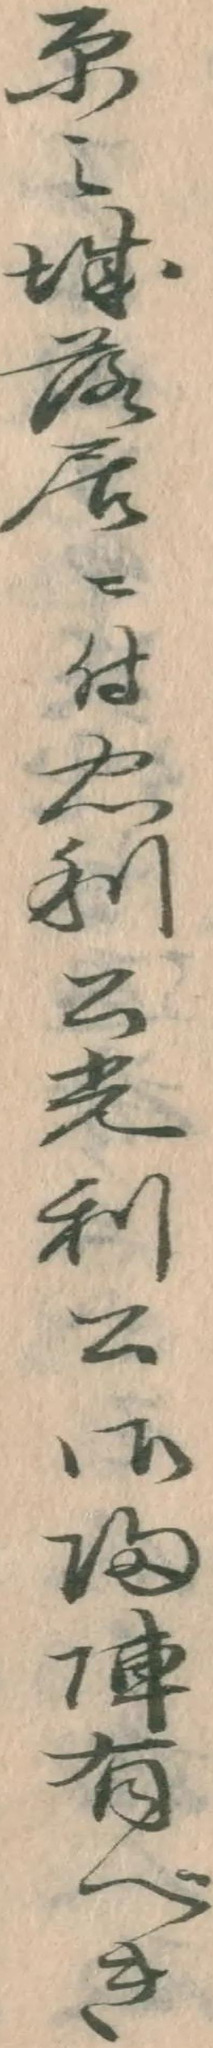原之城落居に付忠利公光利公御帰陣有べき
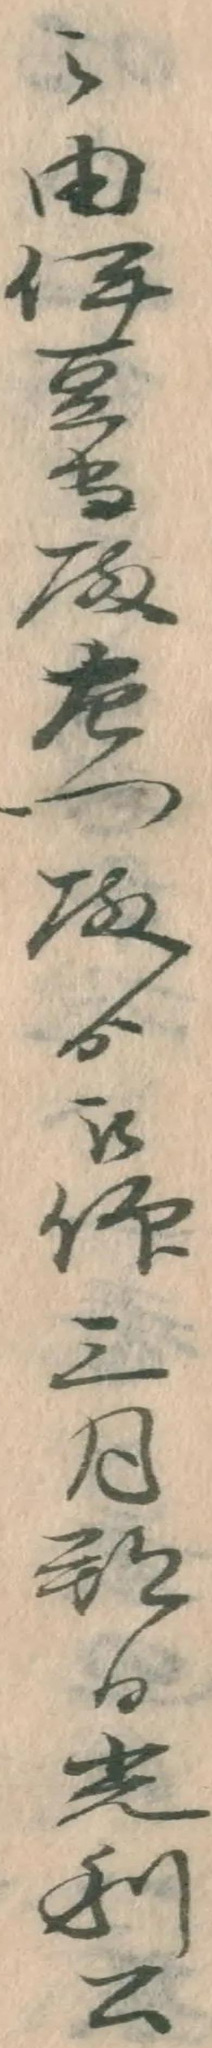之由伊豆守殿左門殿ゟ披仰三月朔日光利公
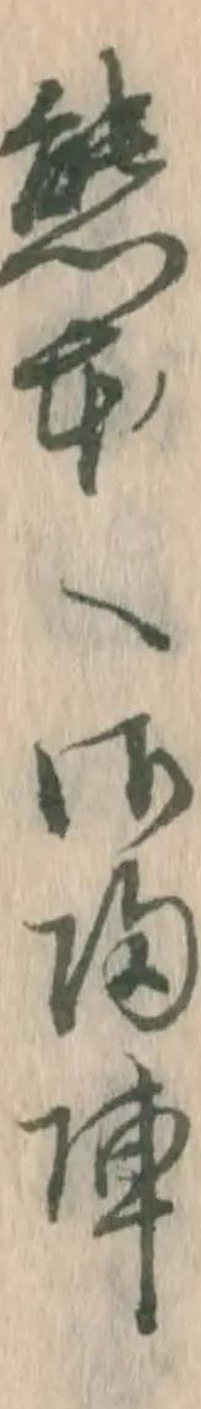熊本へ御帰陣
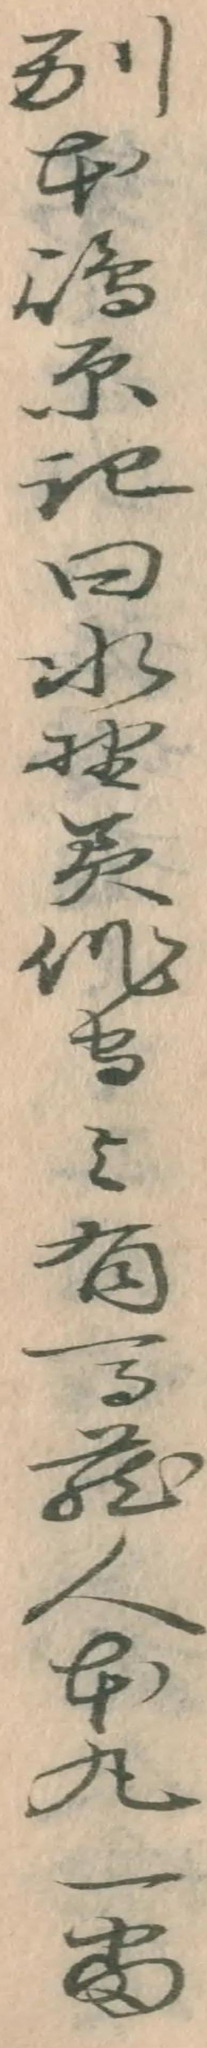別本島原記曰水野美作守与有馬蔵人本丸一番
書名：切支丹御退治記 49巻. [9]
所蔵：国立国会図書館 National Diet Library, JAPAN
